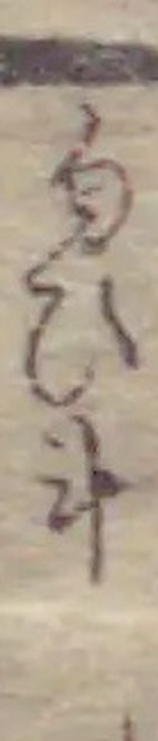匂ひ計

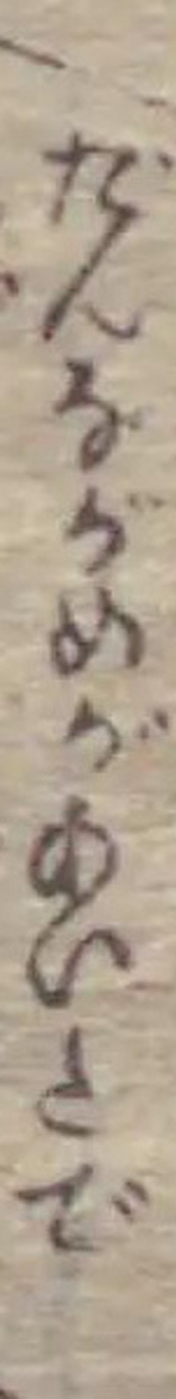だんながめがあいたで
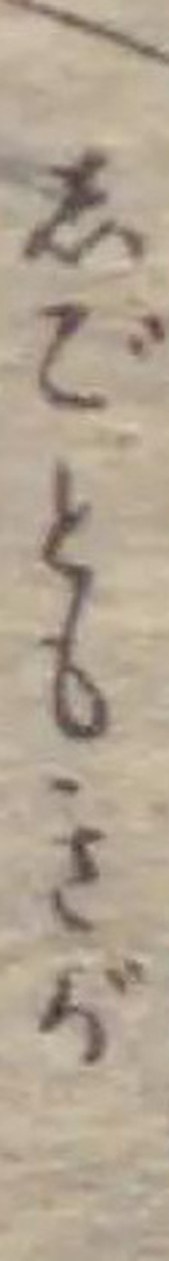しごともきが
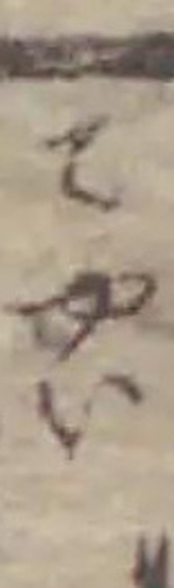てやい
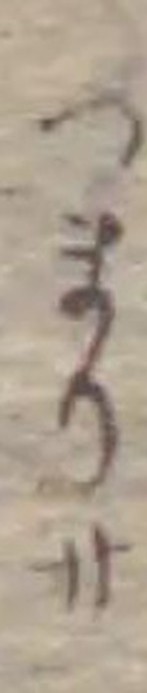つまりサ
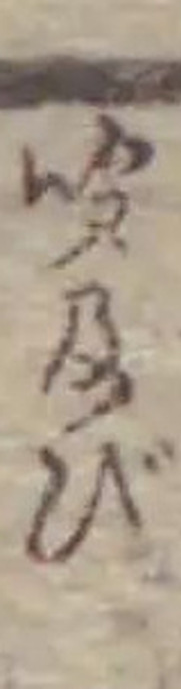聞及び
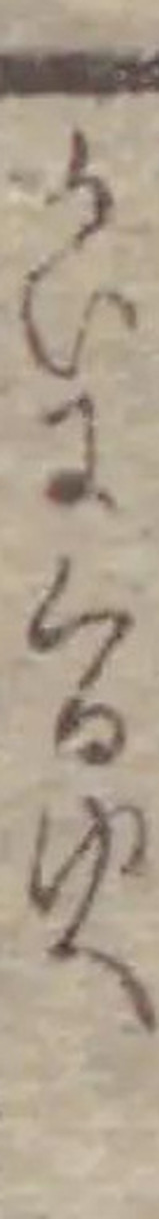かいにくるゆへ
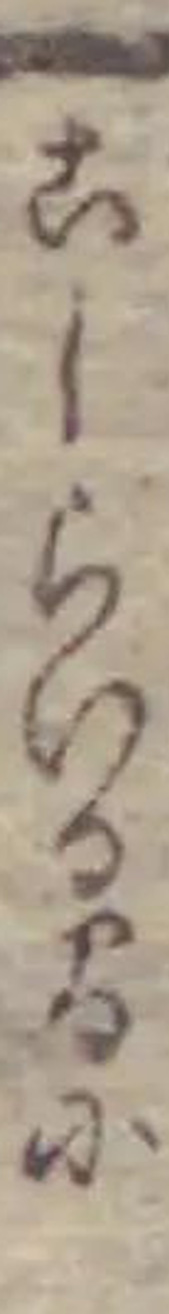こしらいる間に
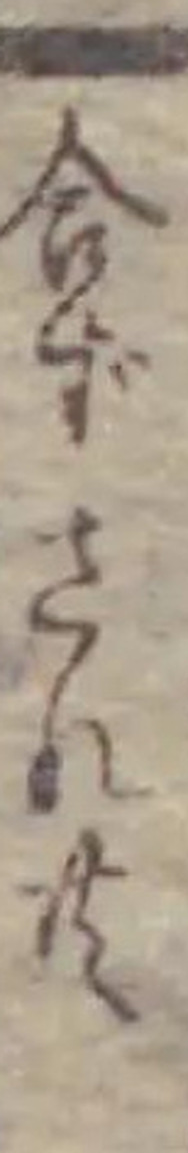合ずされ共
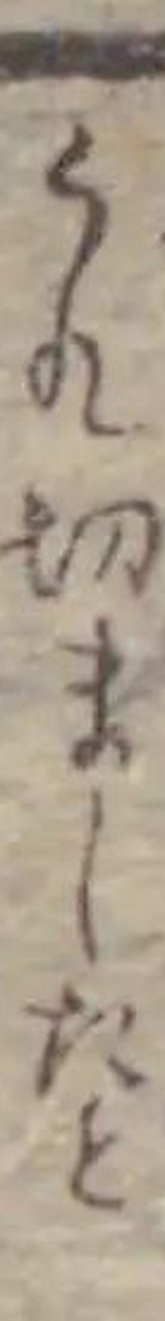うれ切ましたと
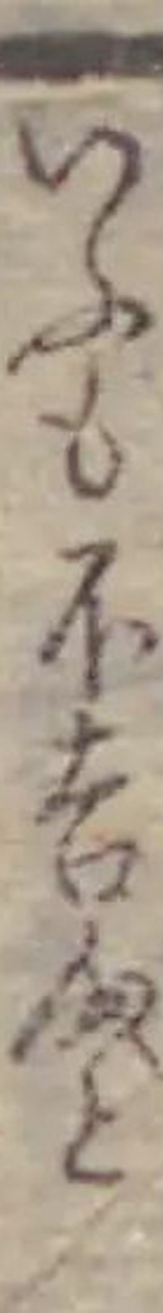いふも不吉成と
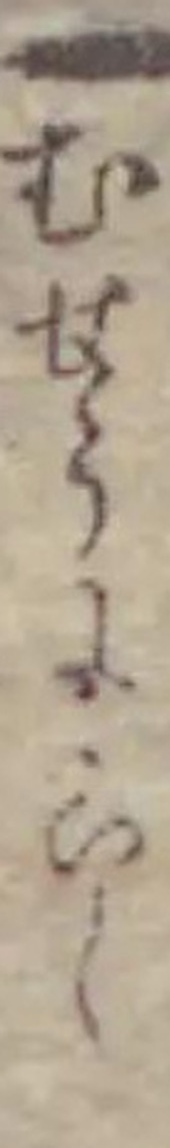むせうにこし
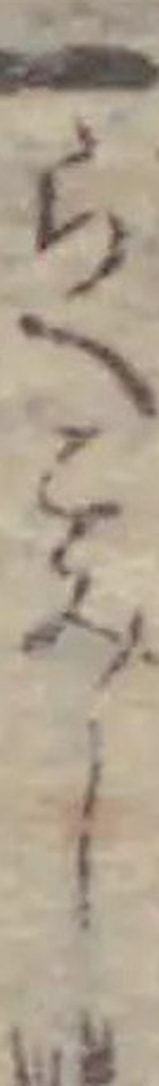らへこみし
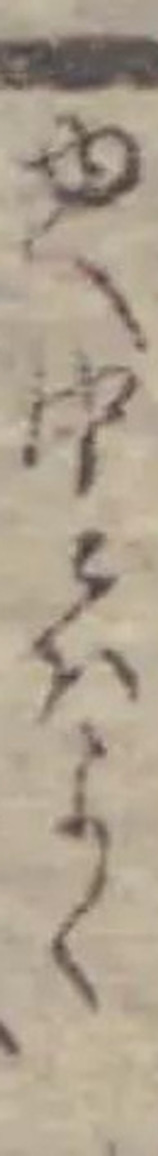ゆへ中にはよく
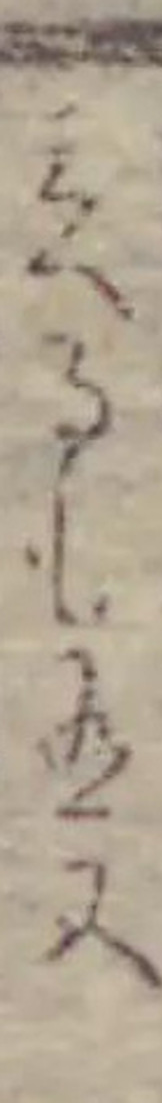みへるも有又
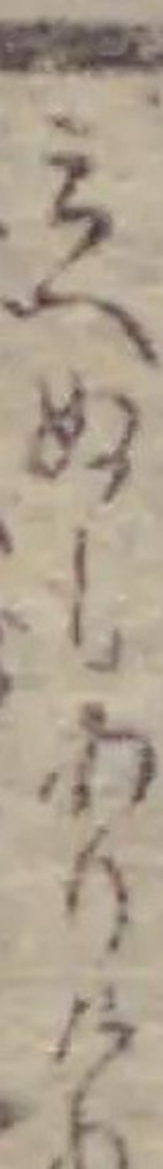みへぬもありけれ
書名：栄増眼鏡徳 3巻
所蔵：国立国会図書館 National Diet Library, JAPAN
